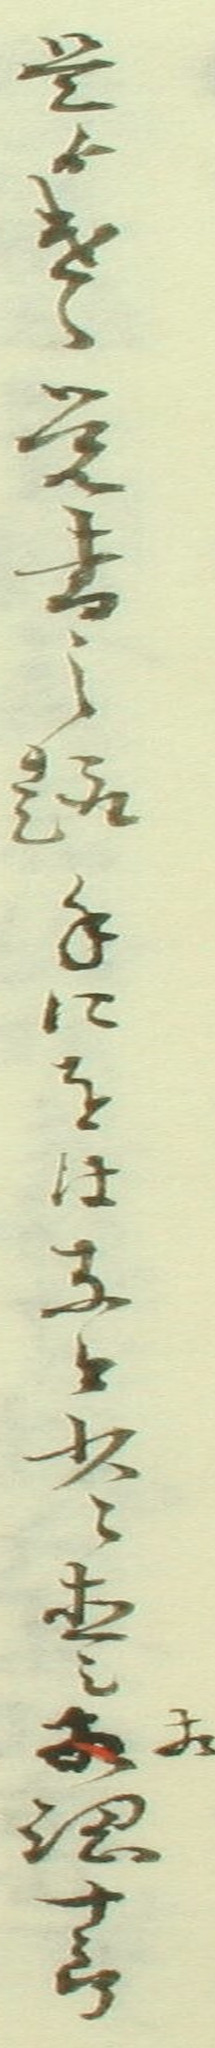是ゟ遣候覚書之趣手にをはなと少々直し相認十郎
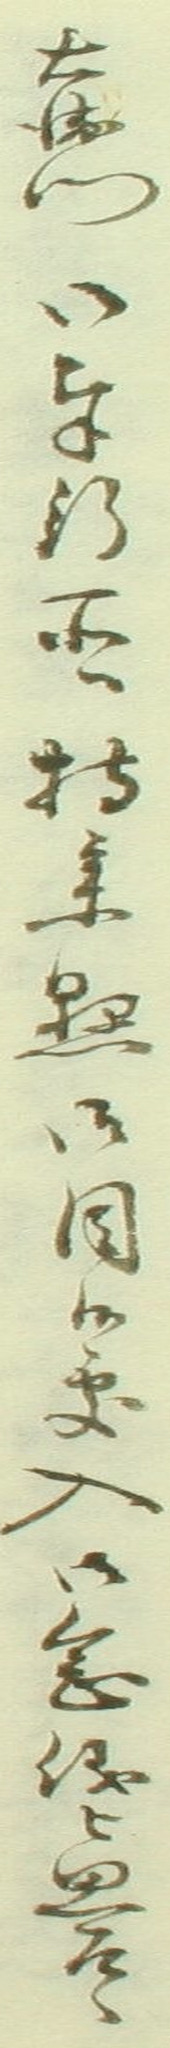右衛門御奉行所へ持参懸御目候処入御念儀被思召候
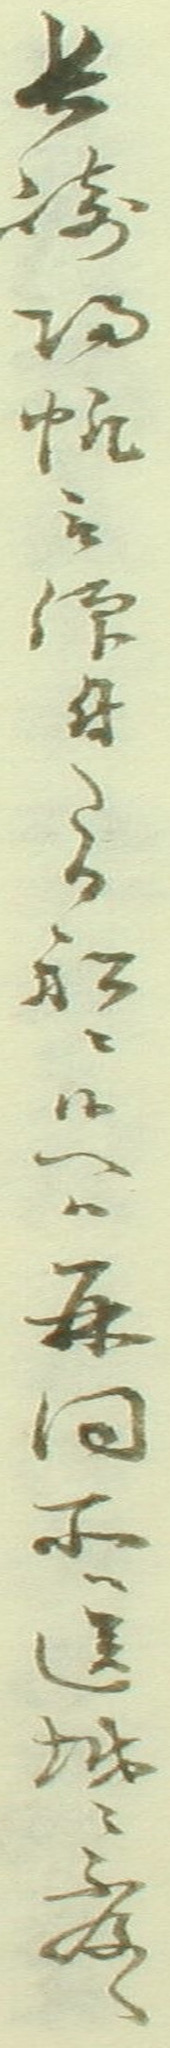長崎帰帆被仰付たる船に候へは再同所へ送儀に不及候
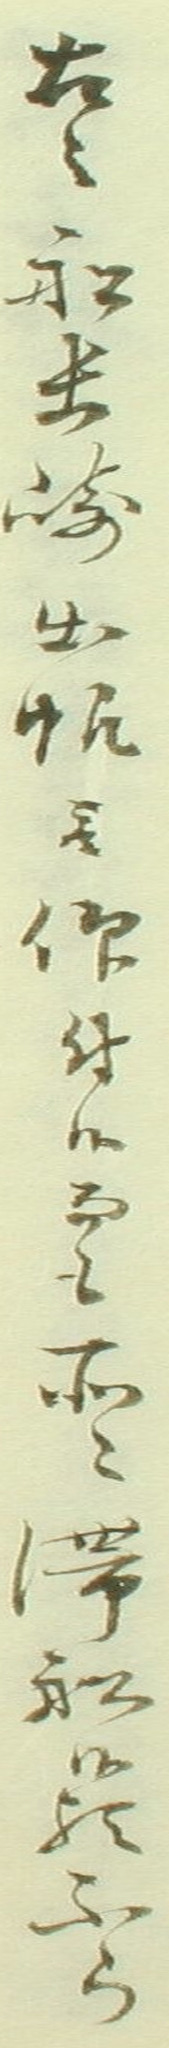右之船長崎出帆被仰付候而も所々滞船候歟ふら
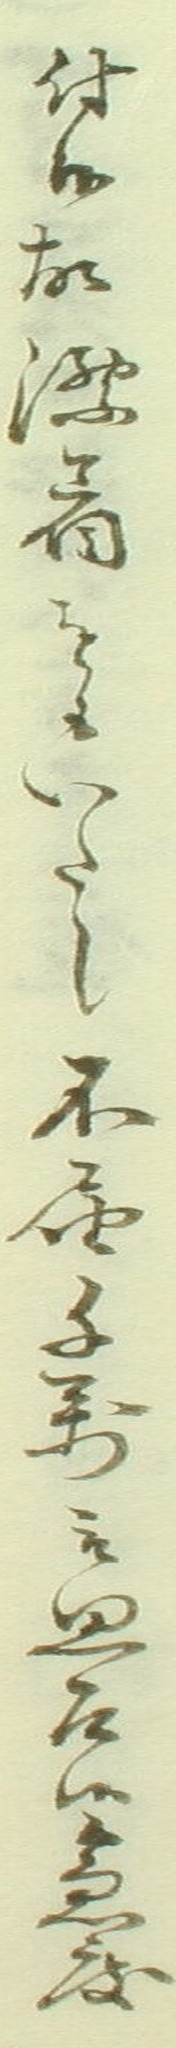付候故漂着をもいたし不届千万被思召候急度
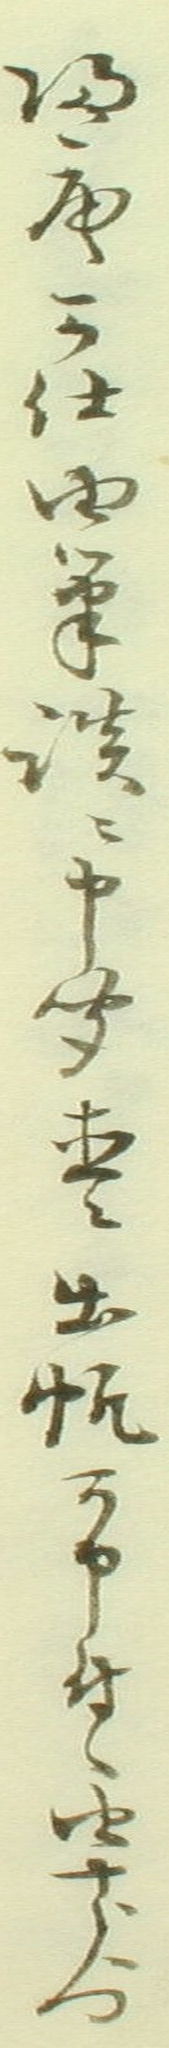帰唐可仕由筆談に申聞直に出帆可申付候由十郎右衛門
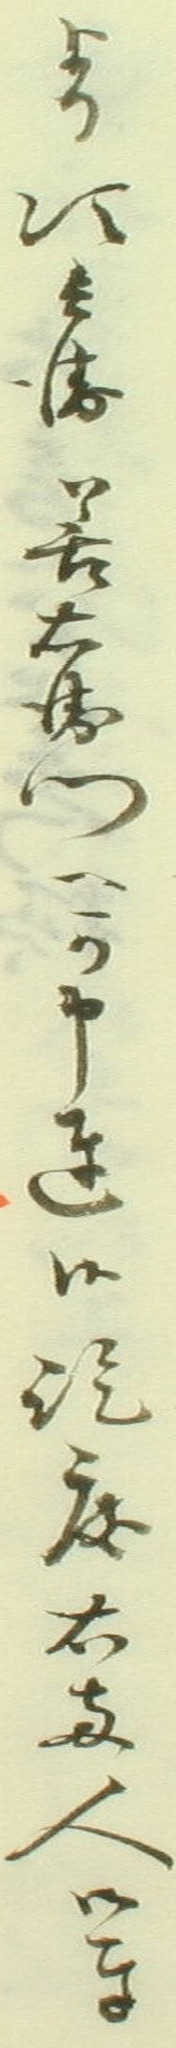より次兵衛善右衛門へ可申達候屹度右両人御奉
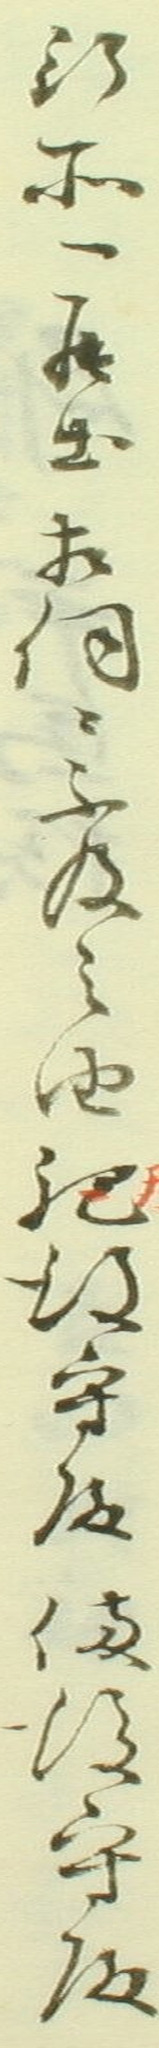行所へ罷出相伺に不及之由肥後守殿備後守殿
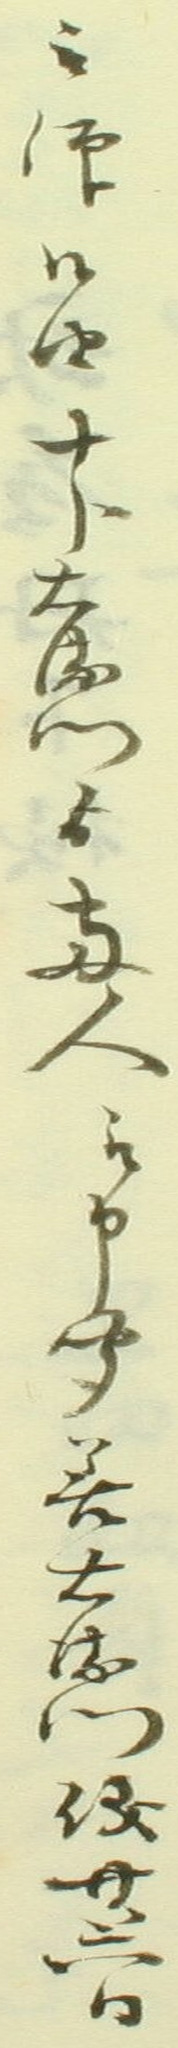被仰候由十郎右衛門ゟ両人被申聞善右衛門儀に廿六日
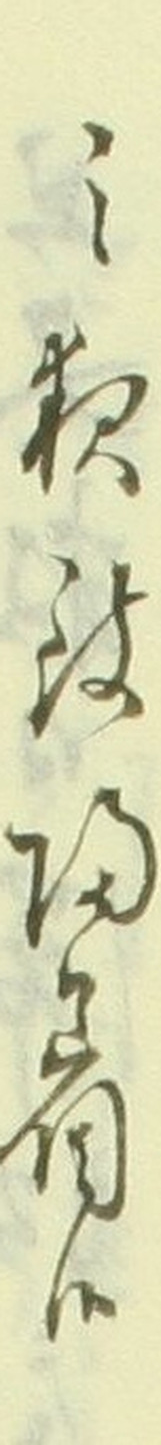之夜致帰着候
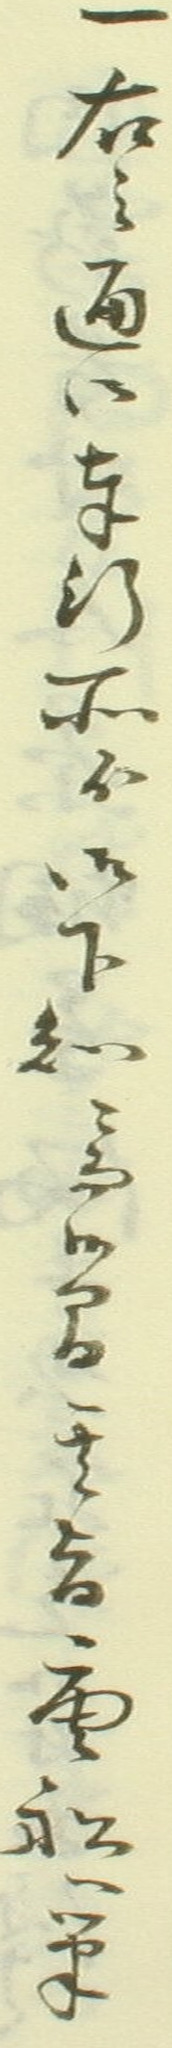一右之通御奉行所ゟ御下知に而候間其旨唐船へ筆
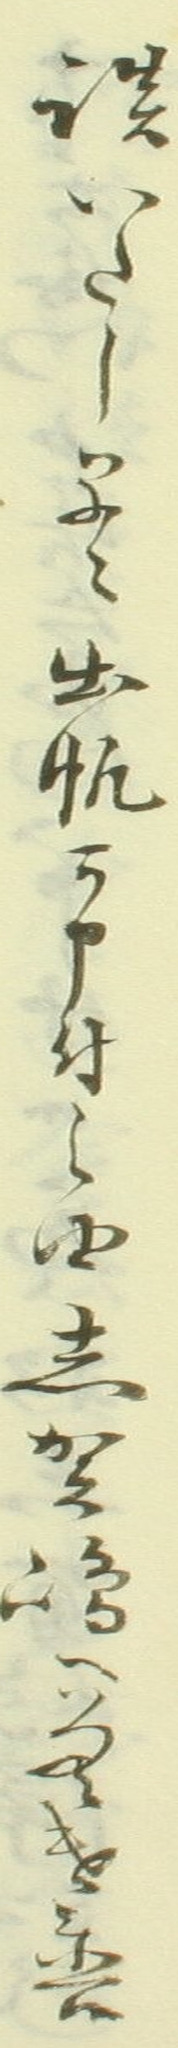談いたし早々出帆可申付之由志賀島へ差遣置候
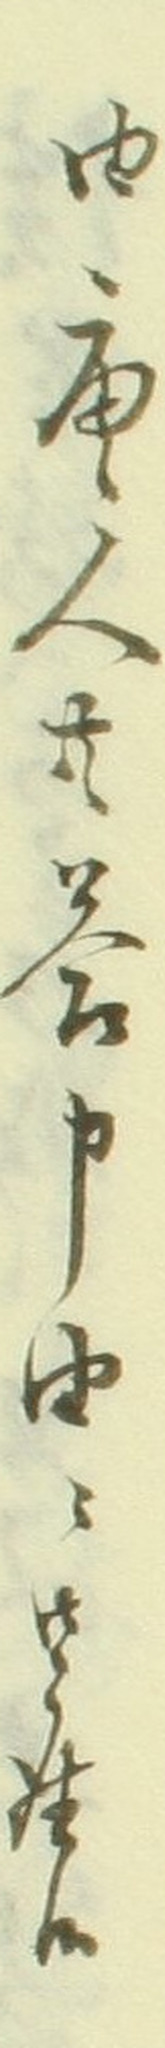由唐人共答申由に御座候
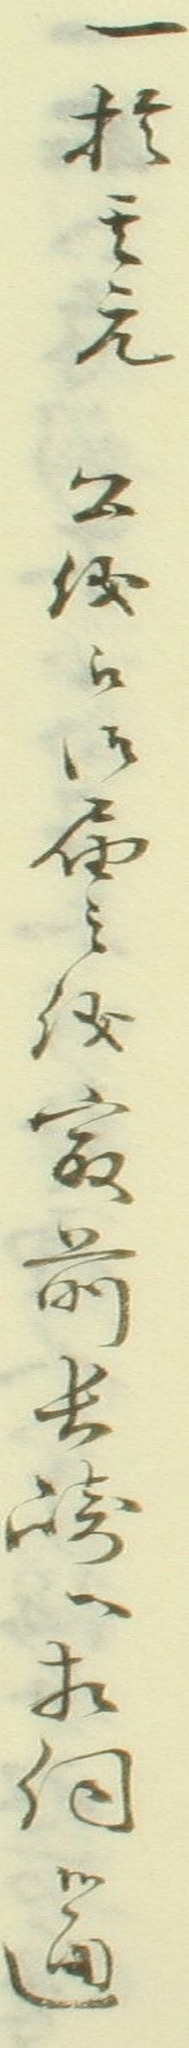一於其元公儀え御届之儀最前長崎へ相伺候通
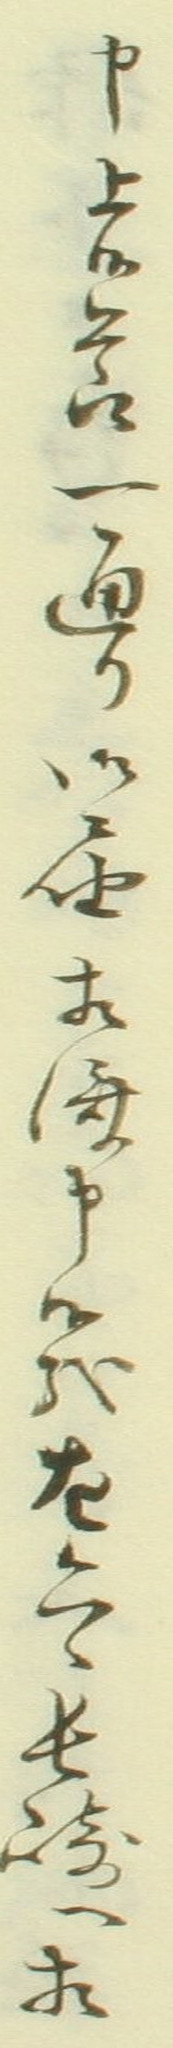申上候節一通り御届相済申候哉左候はゝ長崎へ相
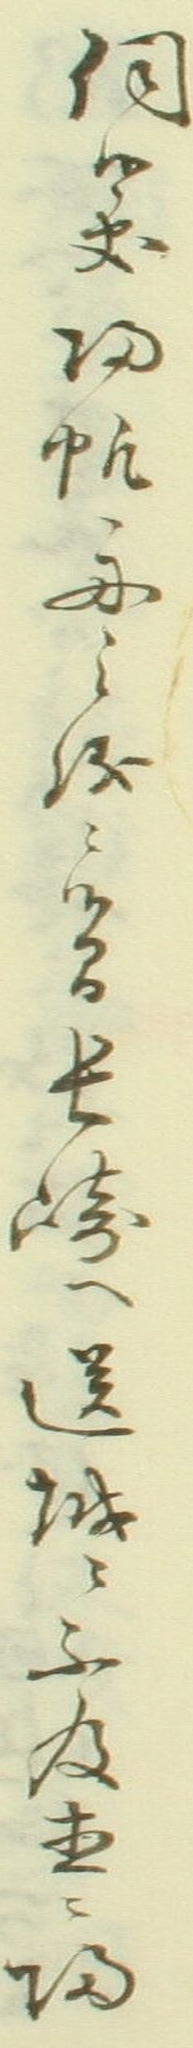伺候処帰帆舟之儀に候間長崎へ送越に不及直に帰
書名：異国船漂着記
